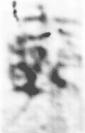鞅
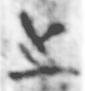之
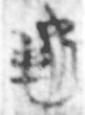○（鞍）
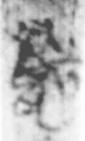○（豻）
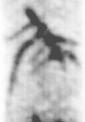尾
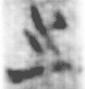之
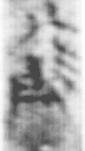雘
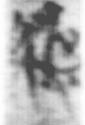紳（靷）
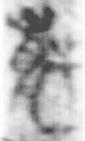○（豻）
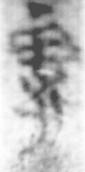○（蒙）
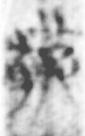鞁
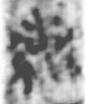○（轡）
